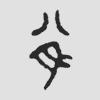八月
